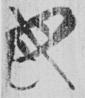母
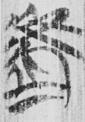虛
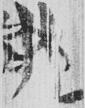牀（壯）
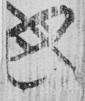母
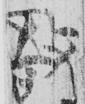敔
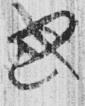母
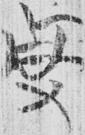○（變）
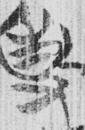事
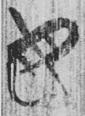母
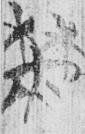焚（煩）
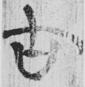古（姑）
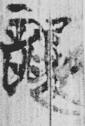謱（嫂○）
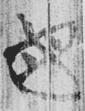母
